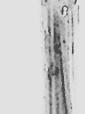不
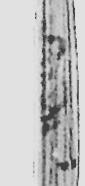快
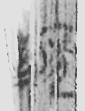戾
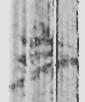之
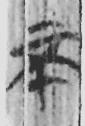不
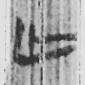亡
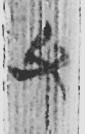父
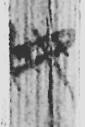母
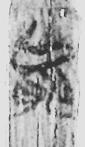能
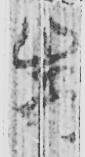生
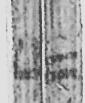亡
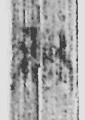君
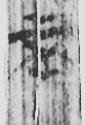不
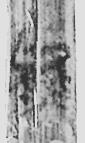能
